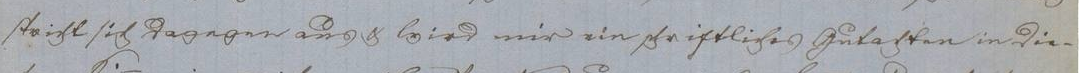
spricht sich dagegen aus & wird mir ein schriftliches Gutachten in die-
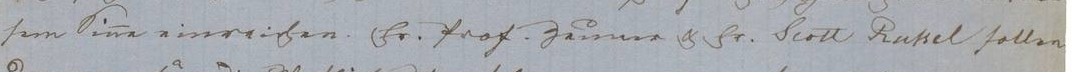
sem Sinne einreichen. Hr. Prof. Zeuner & Hr. Scott Russel sollen
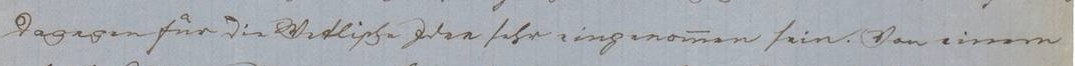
dagegen für die Wetlische Idee sehr eingenommen sein. Von einem
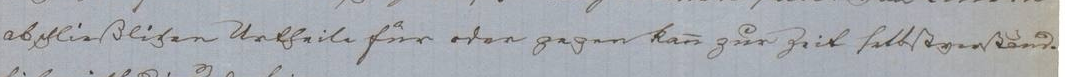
abschließlichen Urtheile für oder gegen kann zur Zeit selbstverständ-
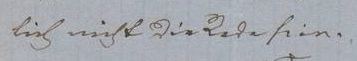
lich nicht die Reide sein.
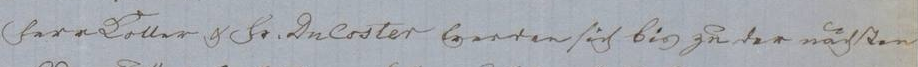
Herr Koller & Hr. Du Coster werden sich bis zu der nächsten
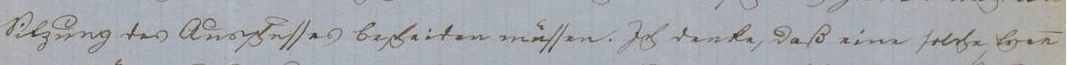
Sitzung des Ausschusses bescheiden müssen. Ich denke, daß eine solche wenn
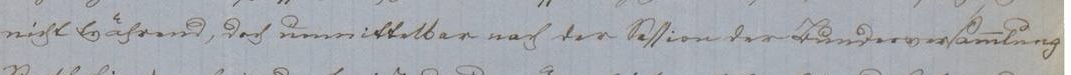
nicht während, doch unmittelbar nach der Session der Bundesversammlung
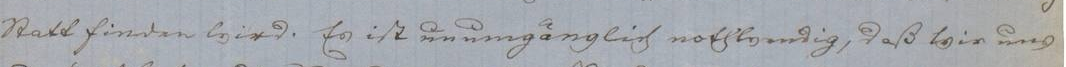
Statt finden wird. Es ist unumgänglich nothwendig, daß wir uns
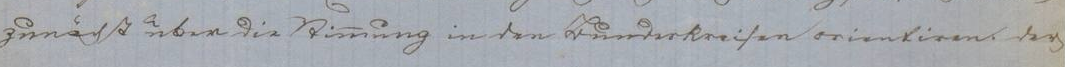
zunächst über die Stimmung in den Bundeskreisen orientiren. Der
